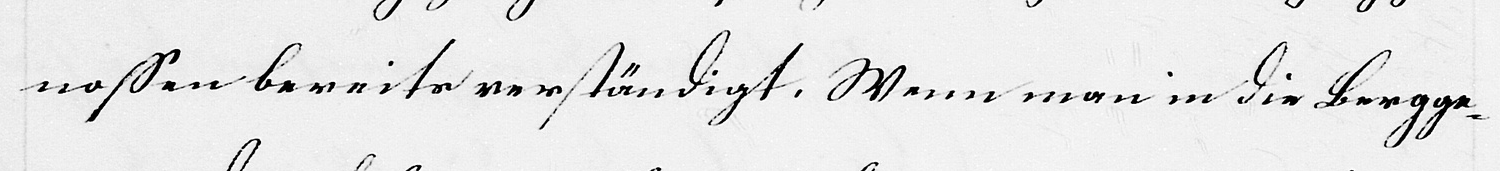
noßen bereits verständigt. Wenn man in die Bergge¬
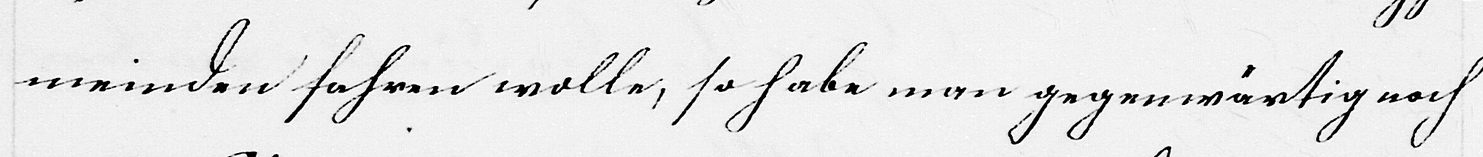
meinden fahren wolle, so habe man gegenwärtig noch
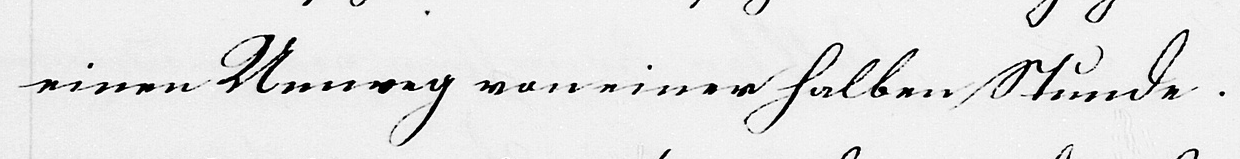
einen Umweg von einer halben Stunde.
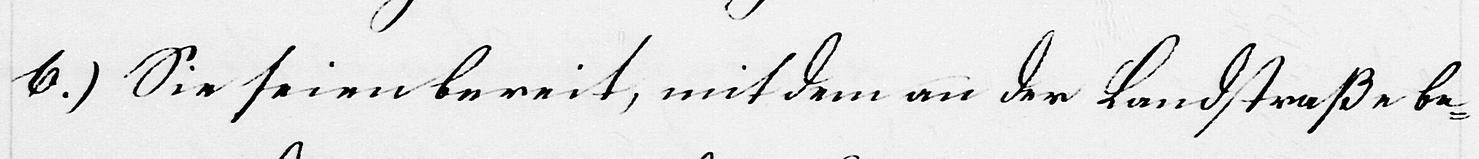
b.) Sie seien bereit, mit dem an der Landstraße be¬
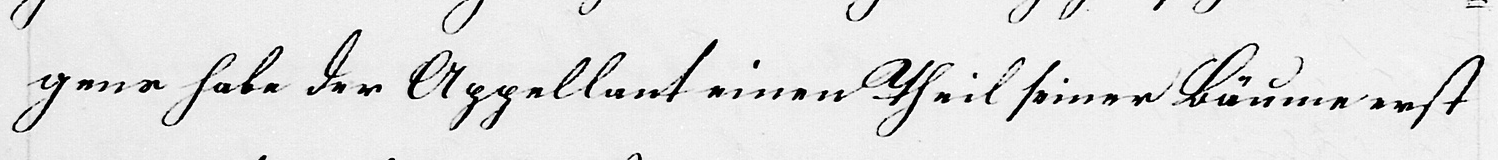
gens habe der Appellant einen Theil seiner Bäume erst
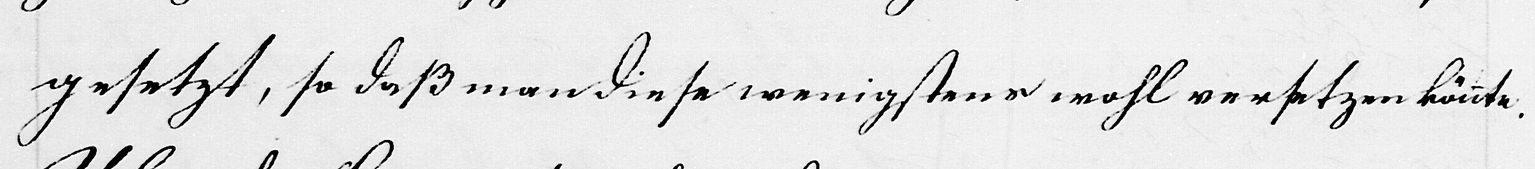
gesetzt, so daß man diese wenigstens wohl versetzen könnte.
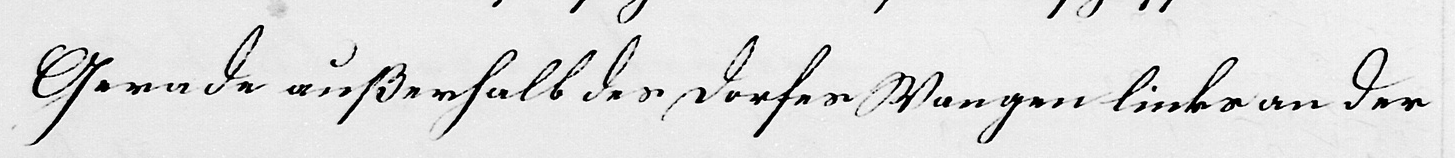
Gerade außerhalb des Dorfes Wangen links an der
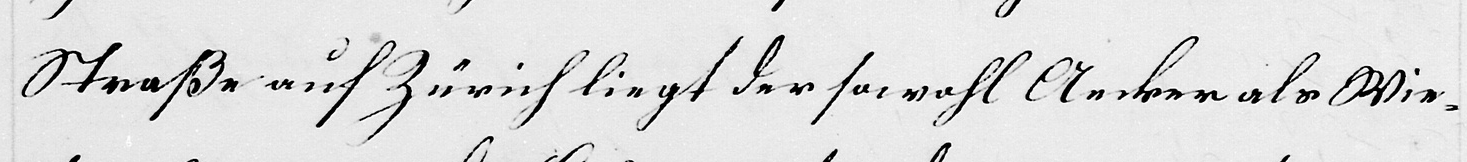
Straße auf Zürich liegt der sowohl Aecker als Wie¬
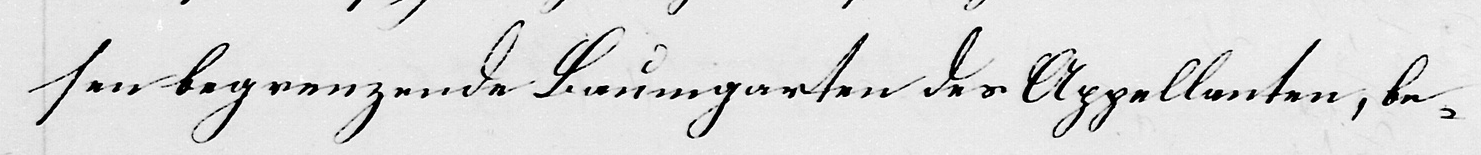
sen begrenzende Baumgarten des Appellanten, be-
